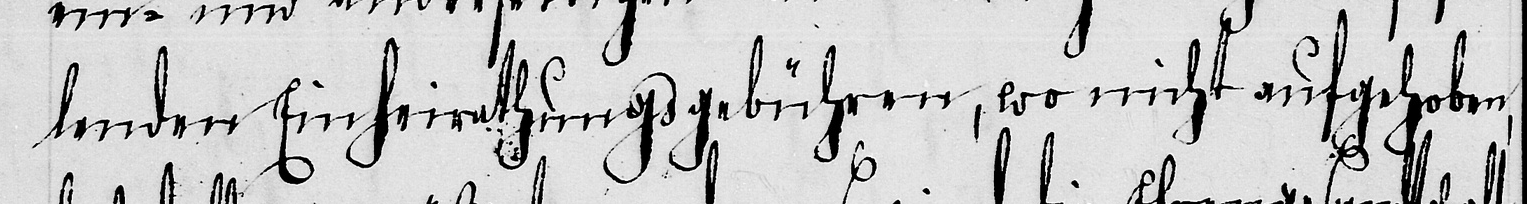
lenden Einheirathungsgebühren, wo nicht aufgehoben,
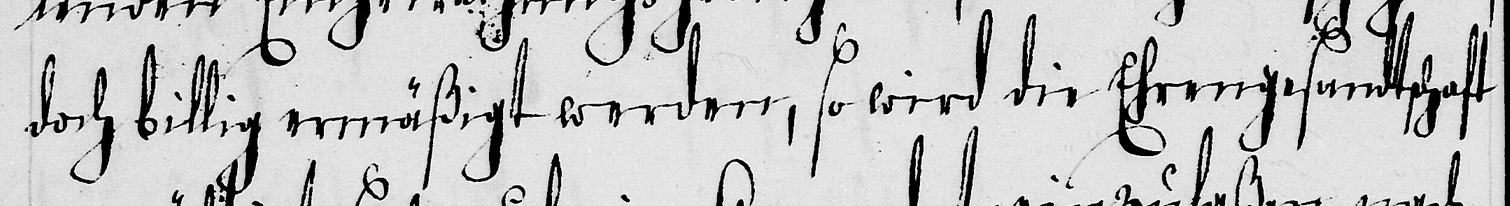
doch billig ermäßigt werden, so wird die Ehrengesandtschaft
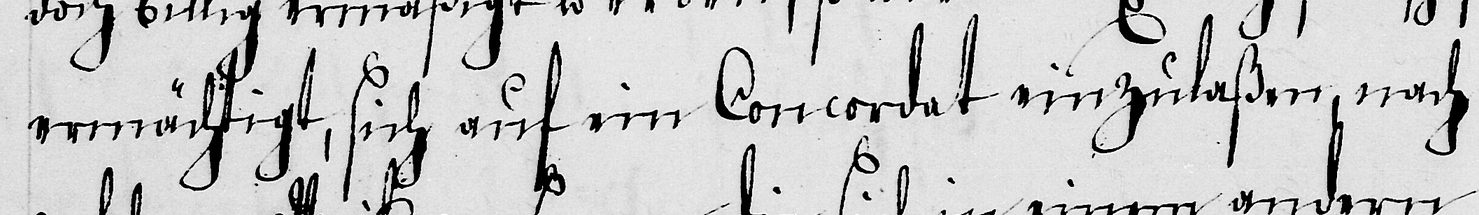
ermächtigt, sich auf ein Concordat einzulaßen, nach
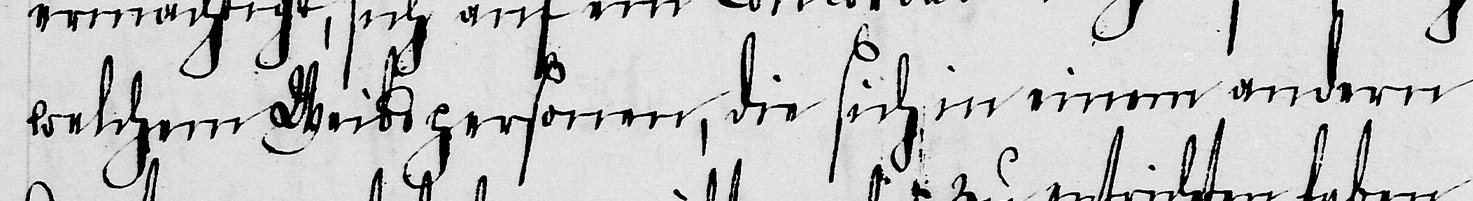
welchem Weibspersonen, die sich in einem andern
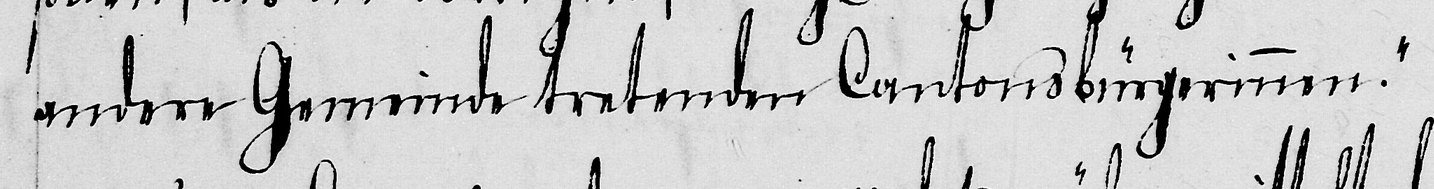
andere Gemeinde tretenden Cantonsbürgerinnen.“
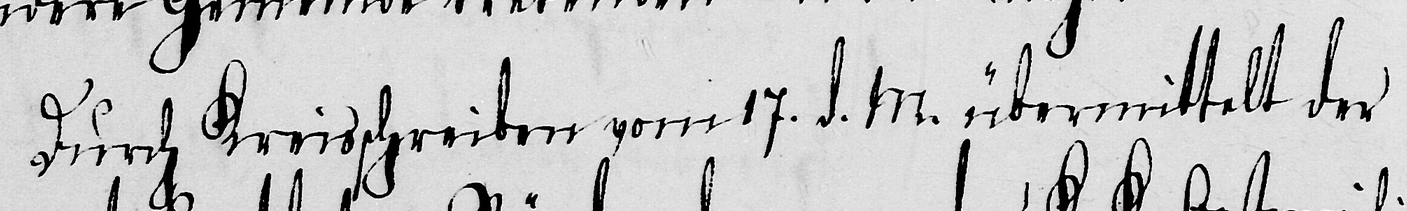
Durch Kreisschreiben vom 17. d. M. übermittelt der
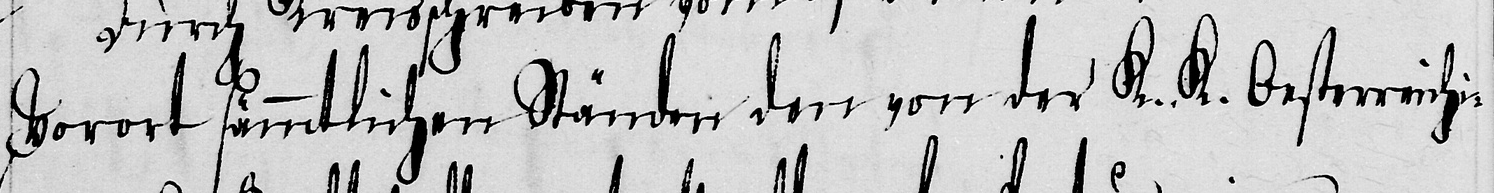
Vorort sämmtlichen Ständen den von der K. K. Oesterreic¬
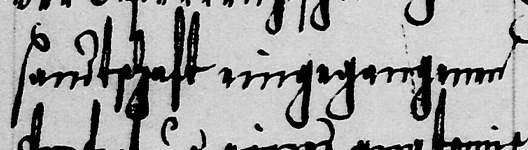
sandtschaft mitgetheilten
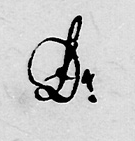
Ge¬
